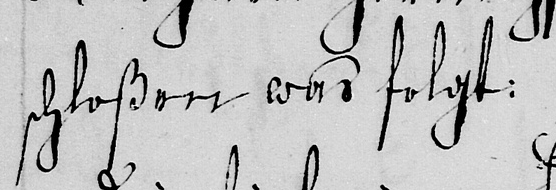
schloßen was folgt:
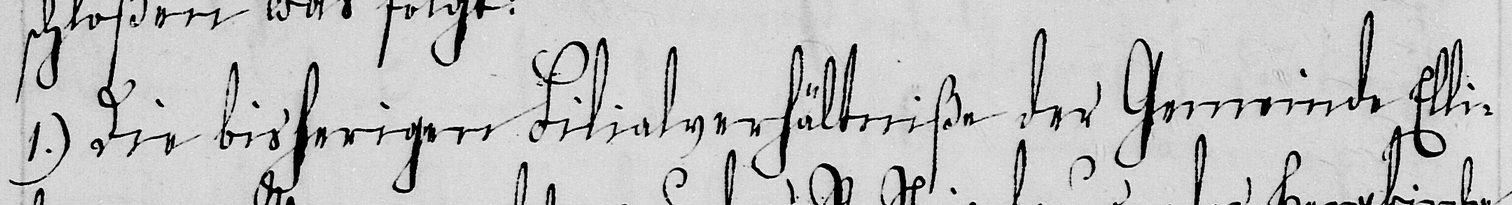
1.) Die bisherigen Filialverhältniße der Gemeinde Ell¬
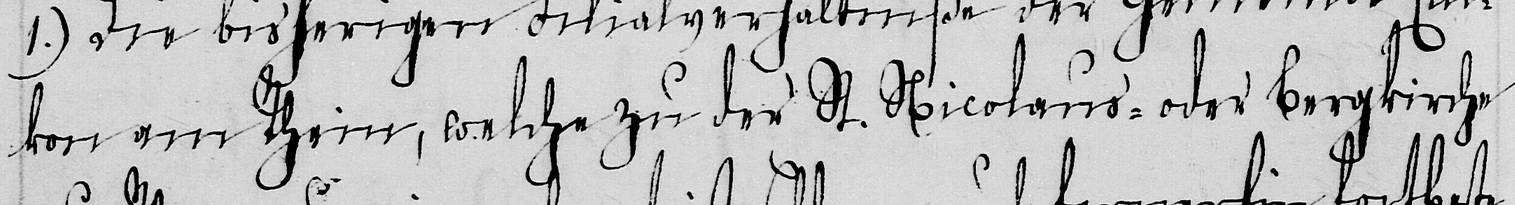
ikon am Rhein, welche zu der St. Nicolaus- oder Bergkirche
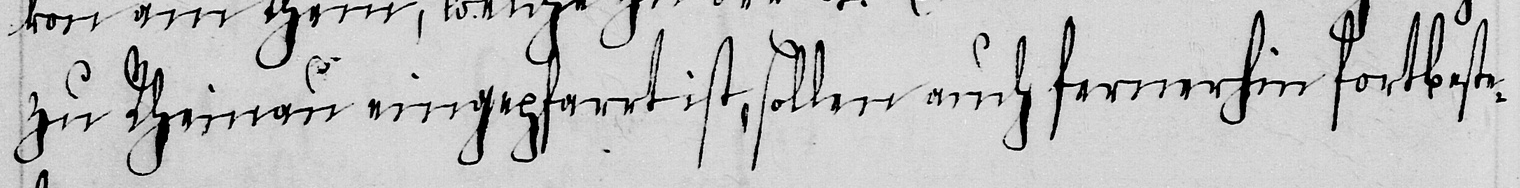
zu Rheinau eingepfarrt ist, sollen auch fernerhin fortbest¬
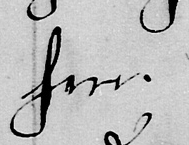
ehen.
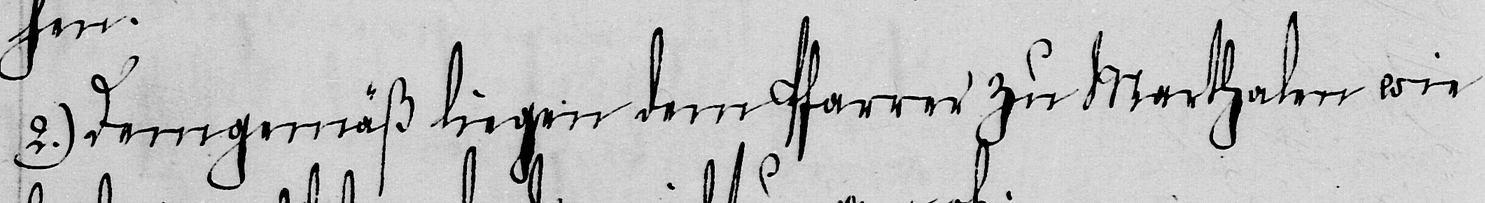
2.) Demgemäß liegen dem Pfarrer zu Marthalen wie
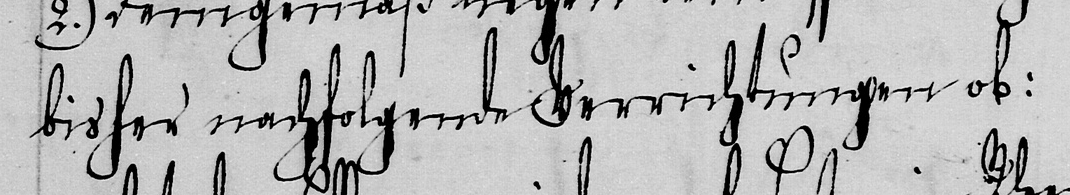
bisher nachfolgende Verrichtungen ob:
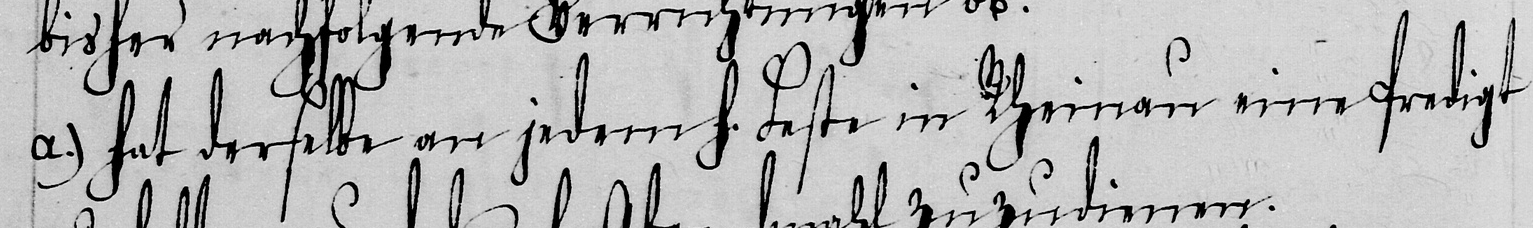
a.) hat derselbe an jedem h. Feste in Rheinau eine Predigt
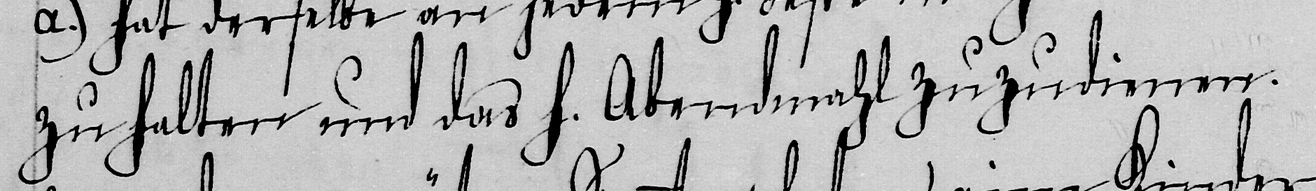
zu halten und das h. Abendmahl zuzudienen.
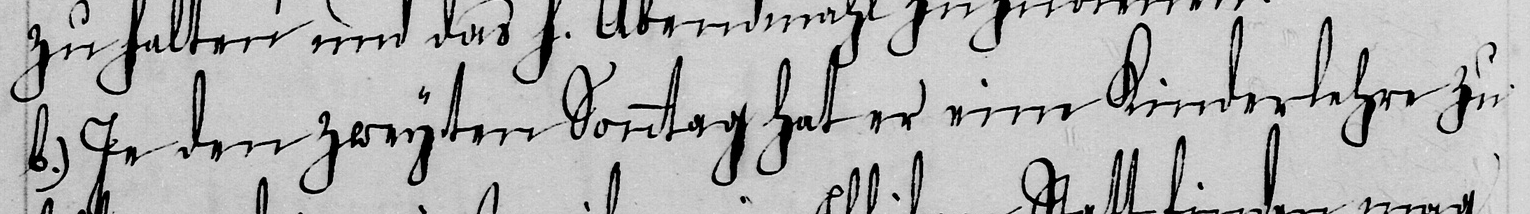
b.) Jeden zweyten Sonntag hat er eine Kinderlehre zu
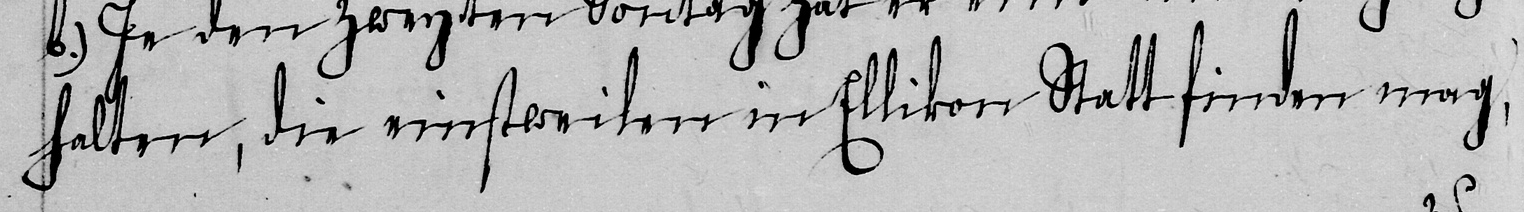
halten, die einstweilen in Ellikon Statt finden mag,
